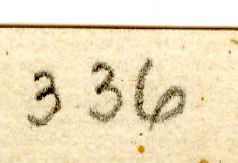336
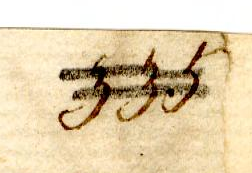[335]
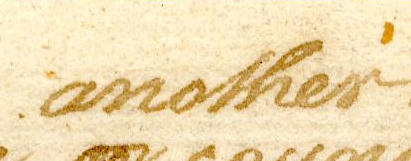another
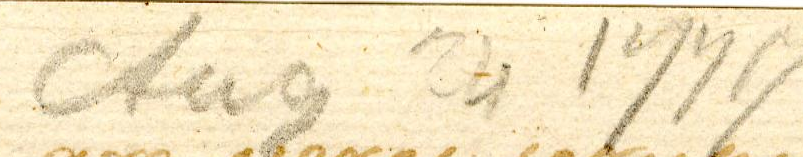Aug 24 1777
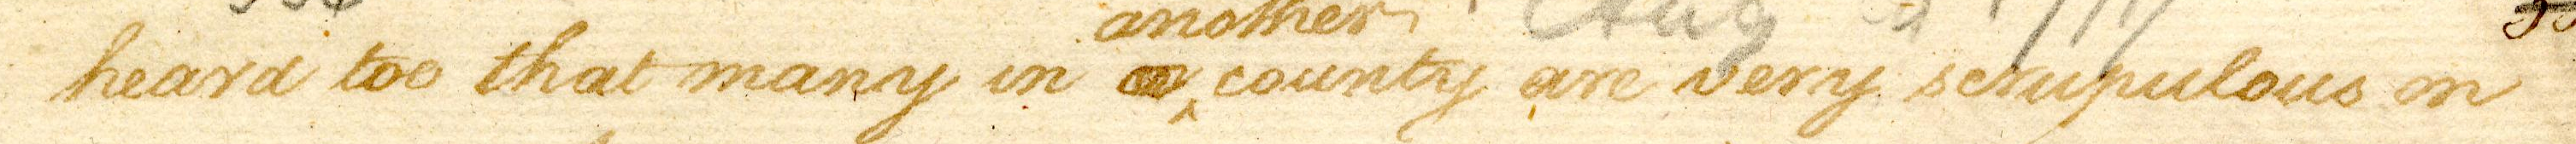heard too that many in [_] ^ country are very scrupulous on
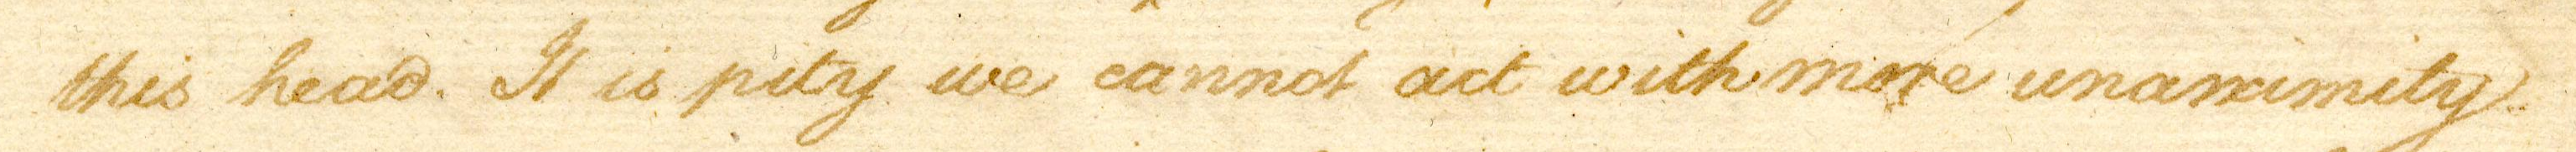this head. It is pity we cannot act with more unanimity
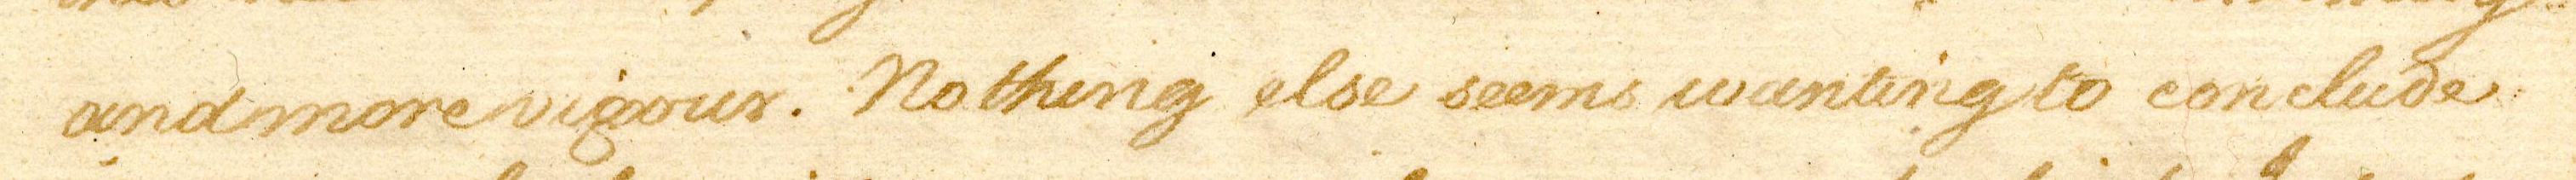and more vigour. Nothing else seems wanting to conclude
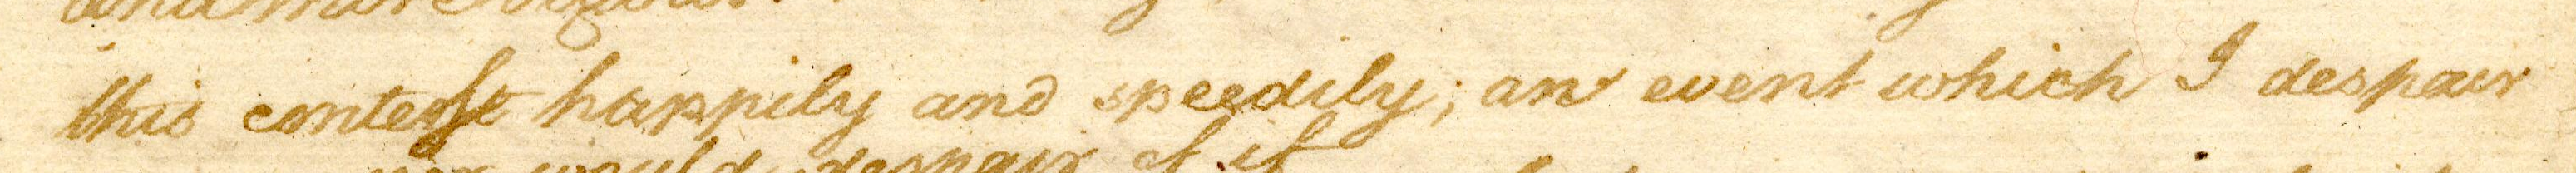this contest happily and speedily; an event which I despair
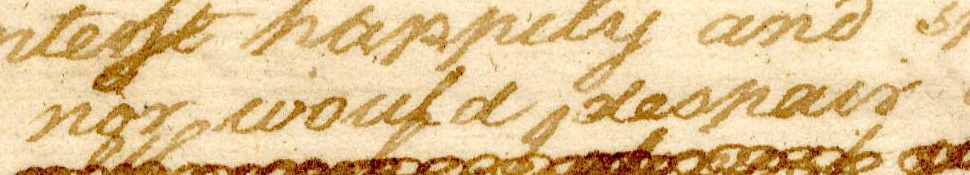nor would despair
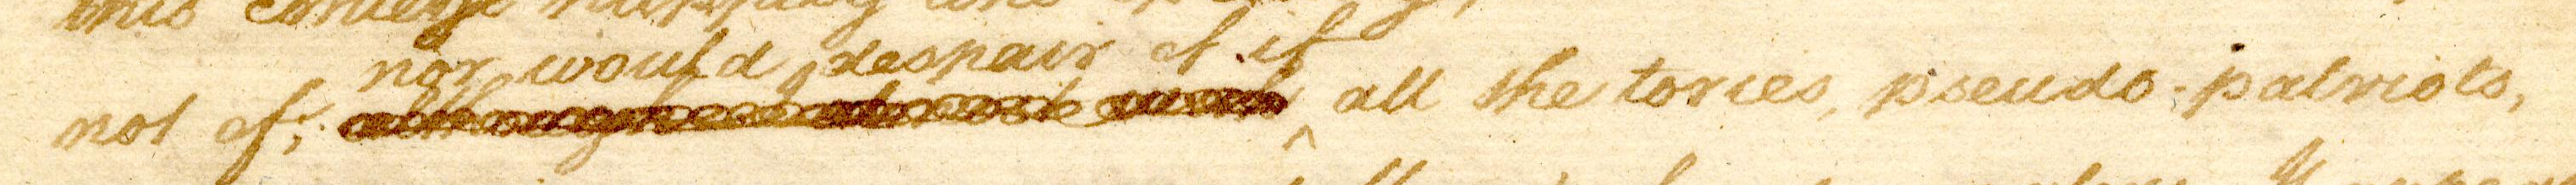not of [___________________] all the tories pseudo patriots,
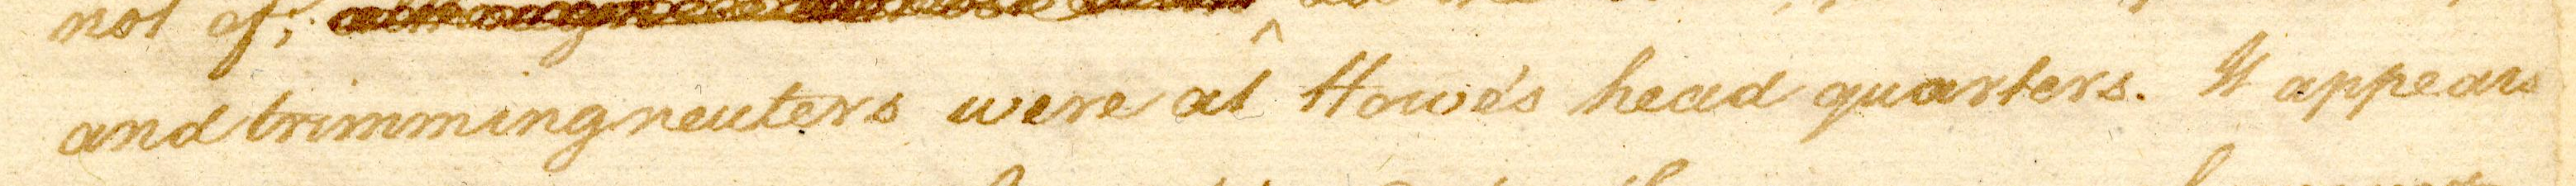and trimming neuters were at Howe's head quarters. It appears
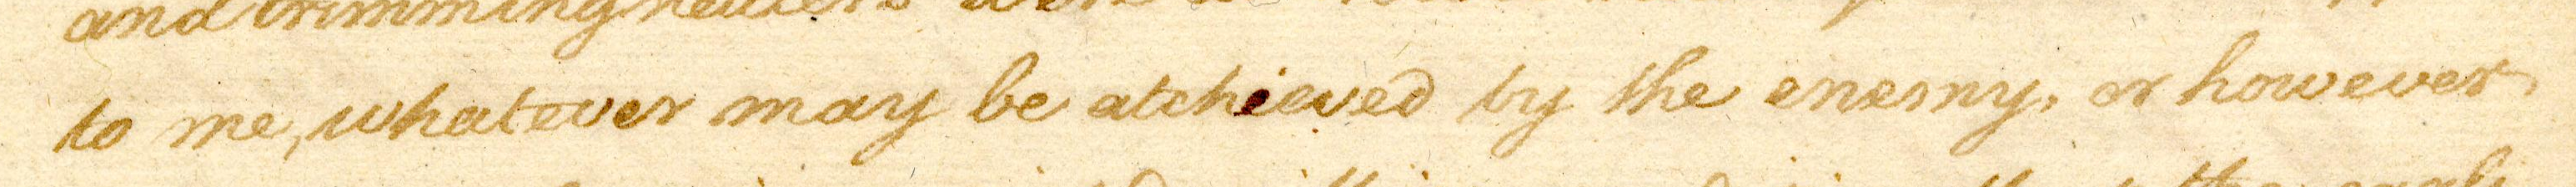to me, whatever may be achieved by the enemy or however
